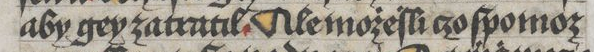aby gey zatratil. Ale možeẛli czo ſpomoz
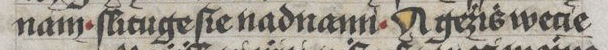nam.ſlituge ſie nad nami.A geżíṡ wecie
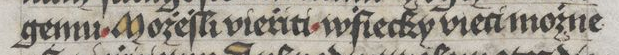gemu.Możeẛli vieṙiti. wẛiecky vieci możne
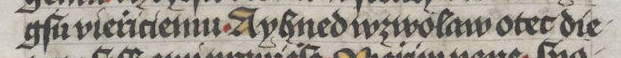gſu vieṙícíemu.Ayhned wzwolaw otec díe¬
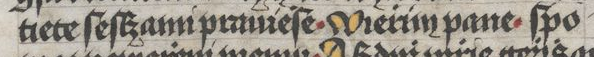tiete ſe ſlzami prauíeẛe.Vieṙím pane.ſpo¬
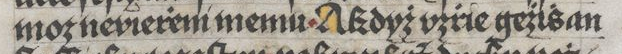moz nevieṙení memu.Akdyż vzṙie geżíṡ an¬
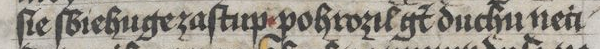ſie ſbiehuge zaſtup.pohrozil ḡt dúchu neċi¬
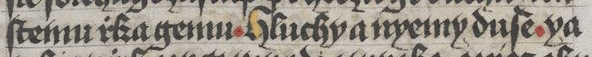temu ṙka gemu.Hluchy a nyemý duẛe.ya¬
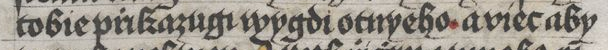tobie pṙikazugi wygdi ot nyeho.a viec aby
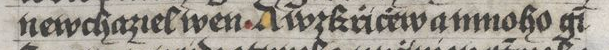newchazíel wen.A wzkṙiċew a mnoho gī
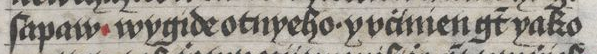ſapaw.wygide ot nyeho.y vċinien ḡt yako
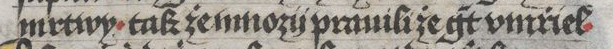mrtwy.tak ve mnozij prauili że ḡt vmřiel
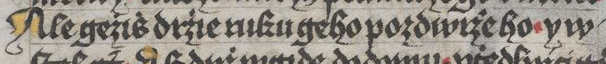Ale geżiṡ drżie ruku geho pozdwiżeho.y w¬
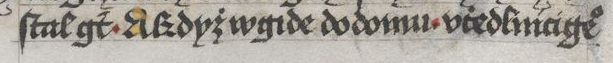ſtcal ḡt.Akdyż wgíde do domu.vċiedliníci geo
